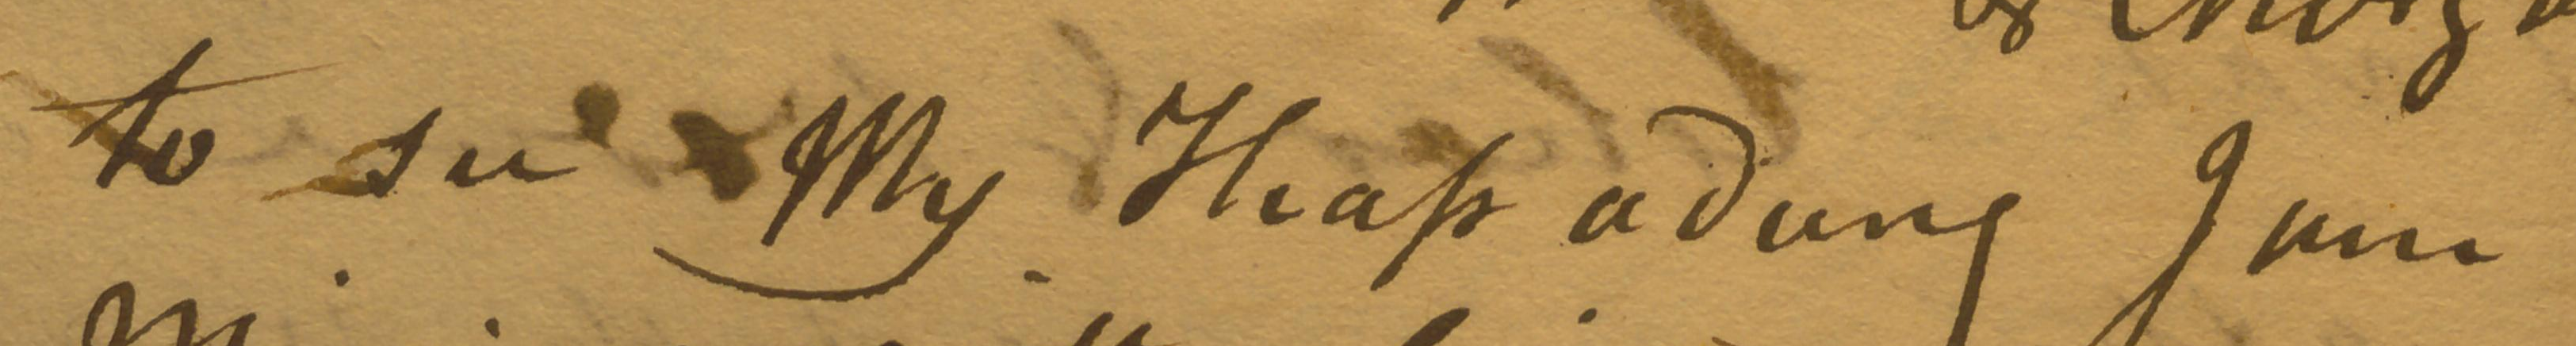to see My Heap a dung I am
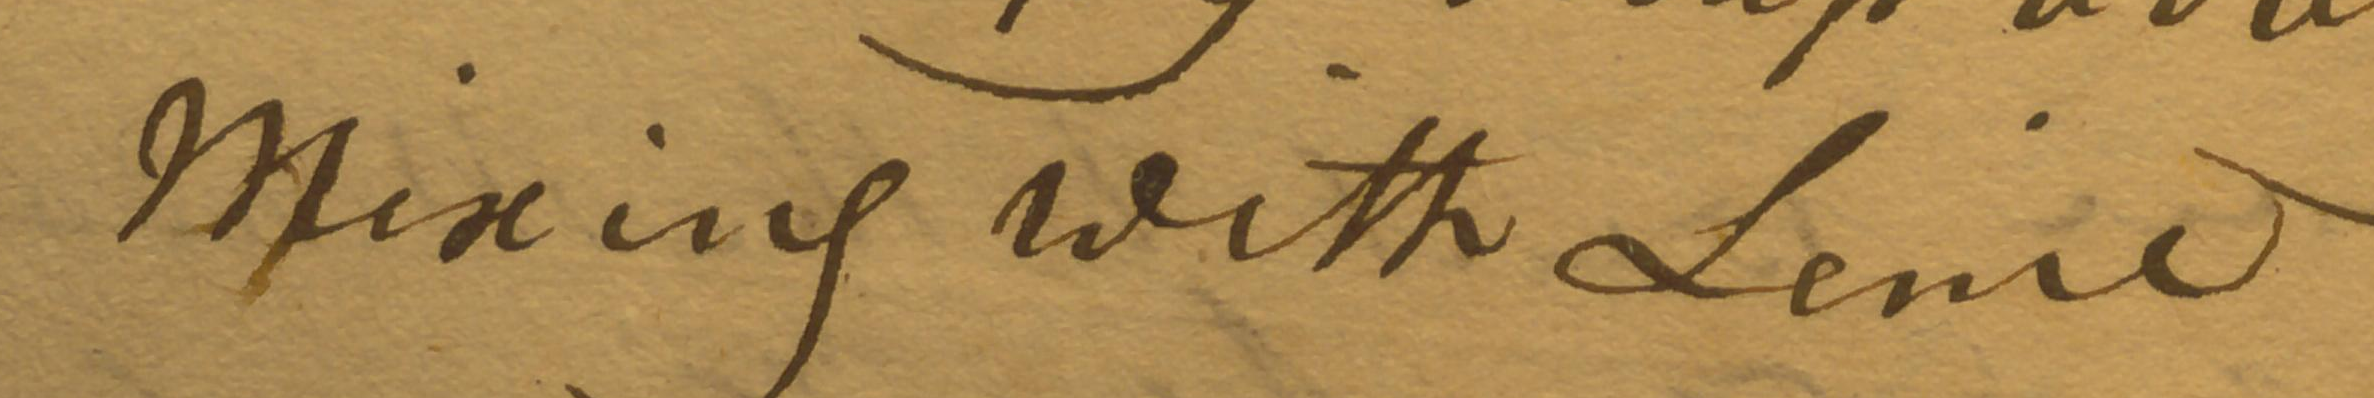Mixing with Lime
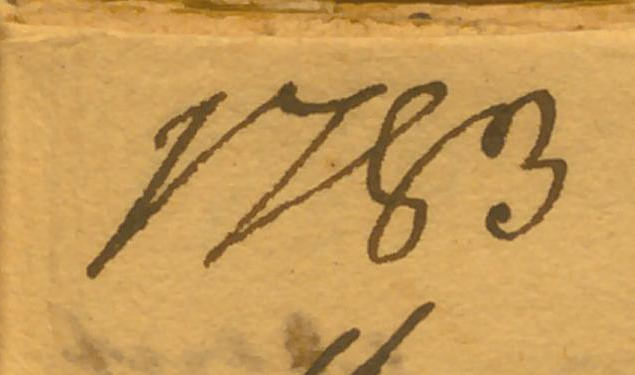1783
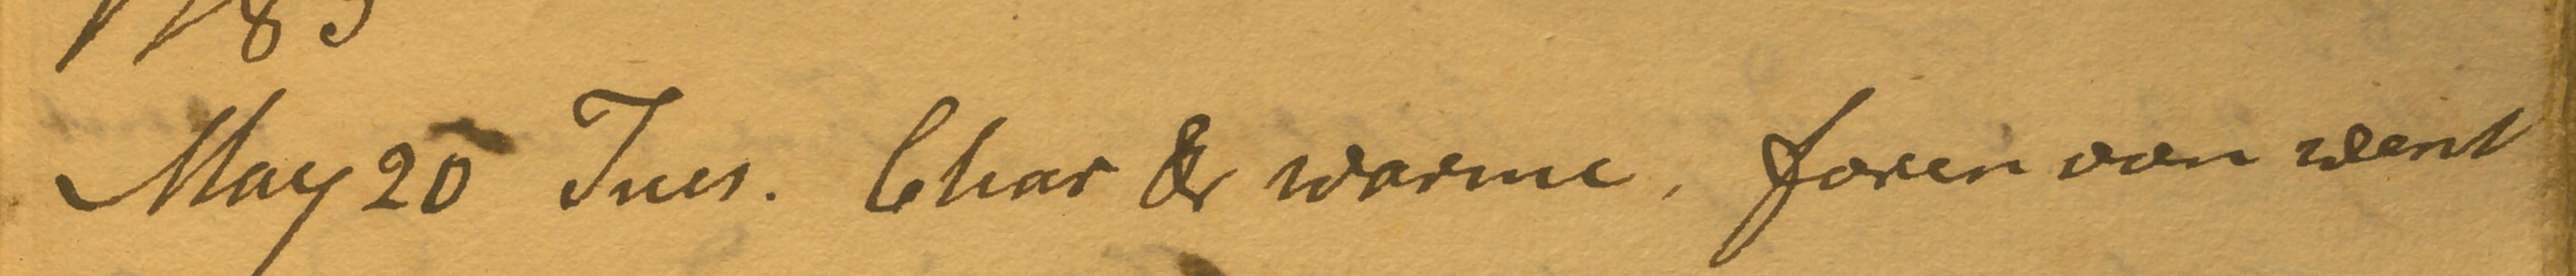May 20 Tues. Clear & warme, forenoon went
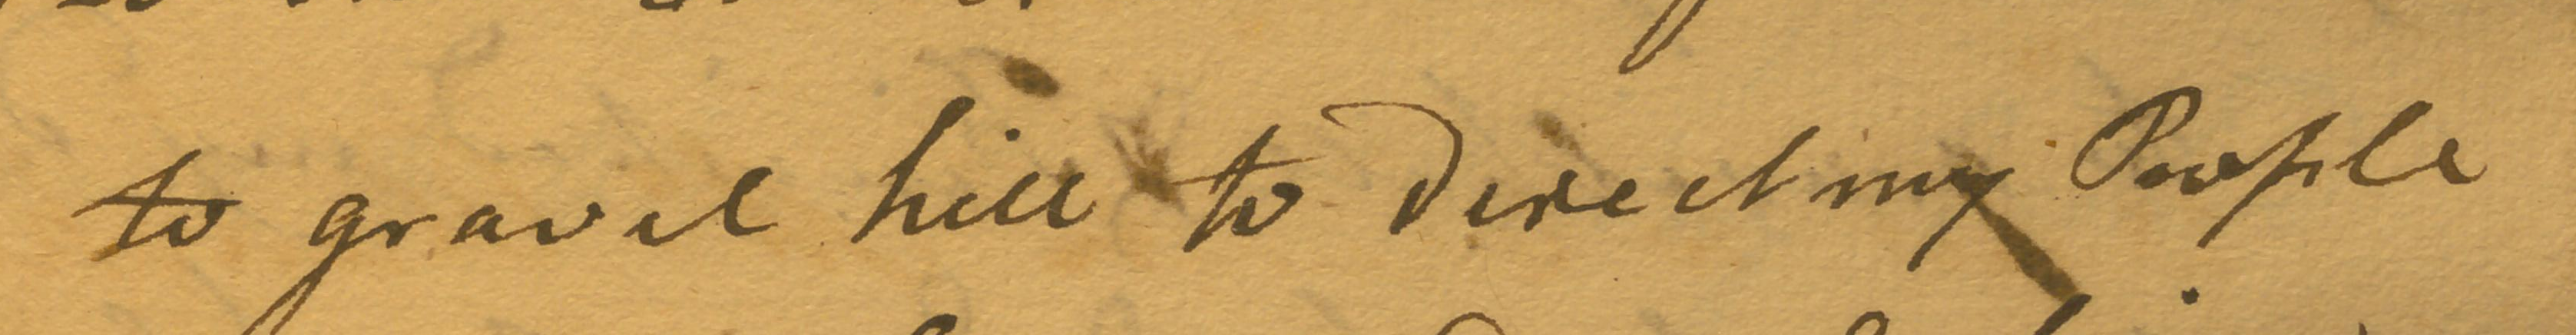to gravel hill to direct my People
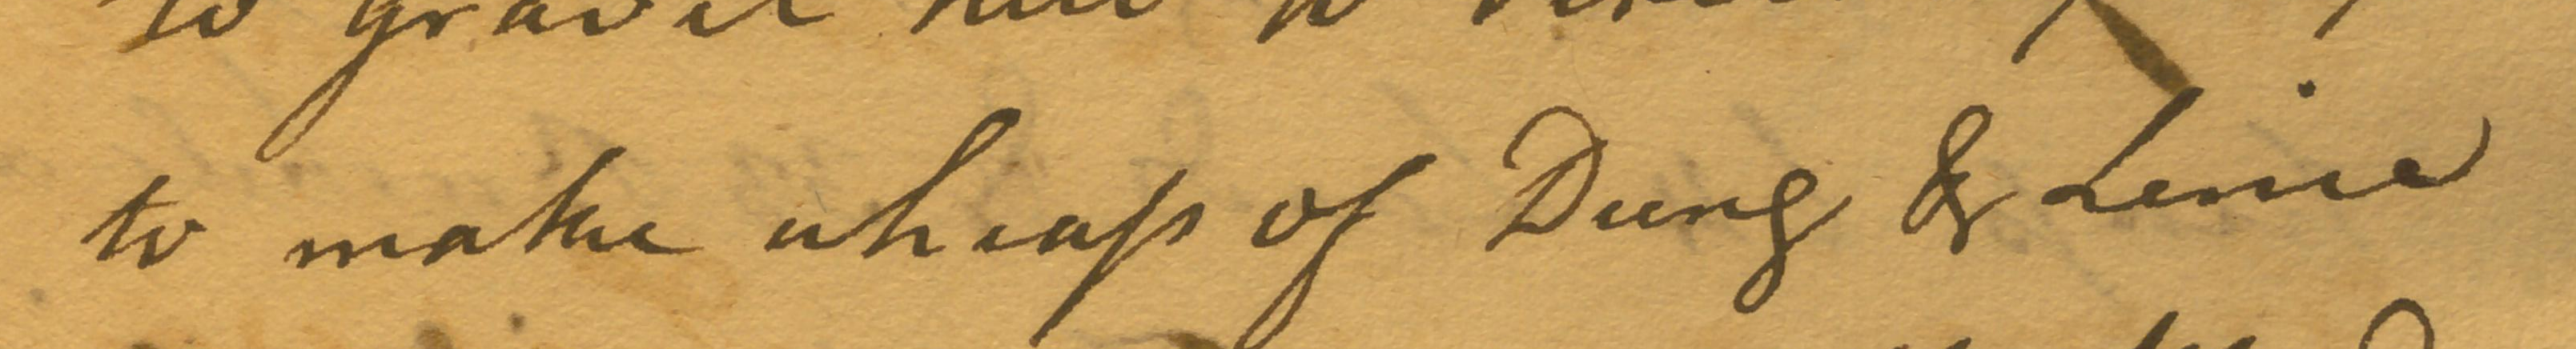to make a heap of Dung & Lime
